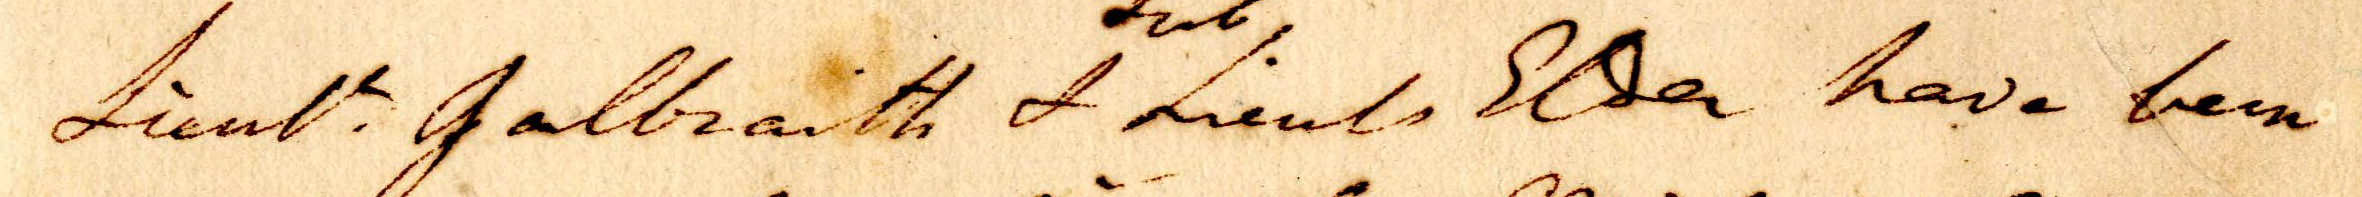Lieut^t. Galbraith & ^ Lieuts Elder have been
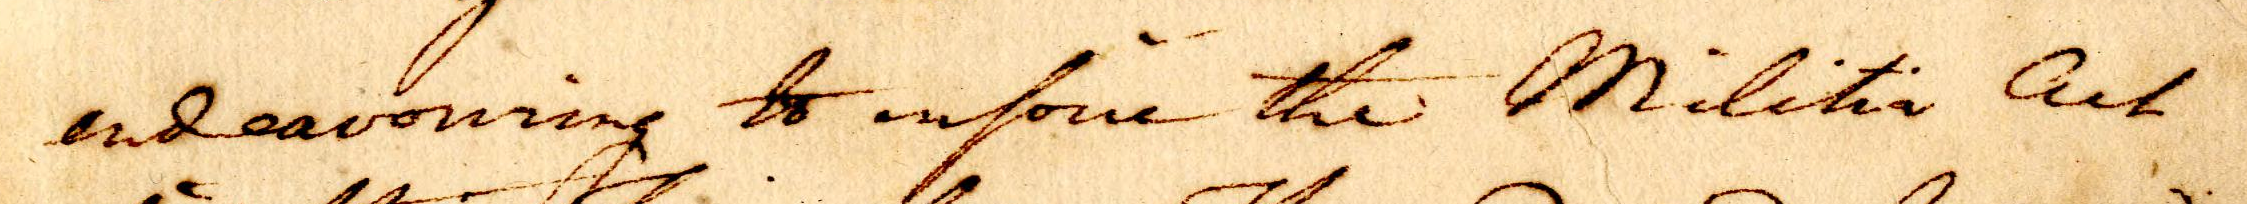endeavouring to inforce the Militia out
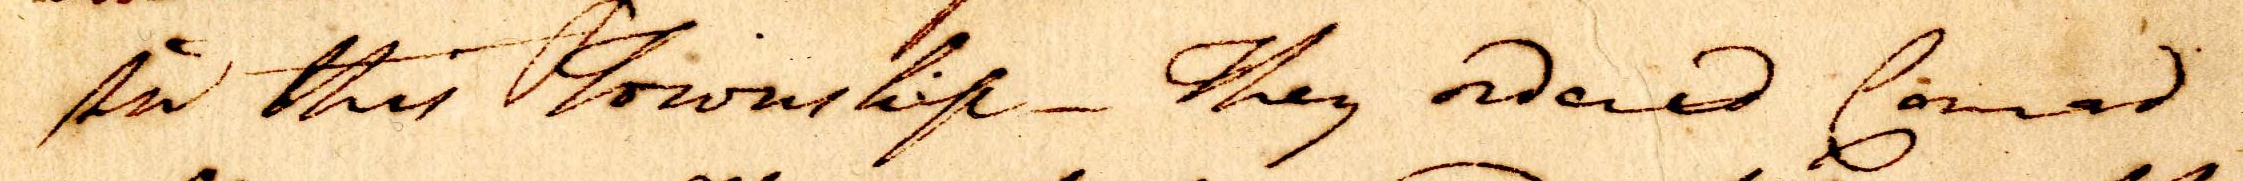in this Township- They ordered Conrad
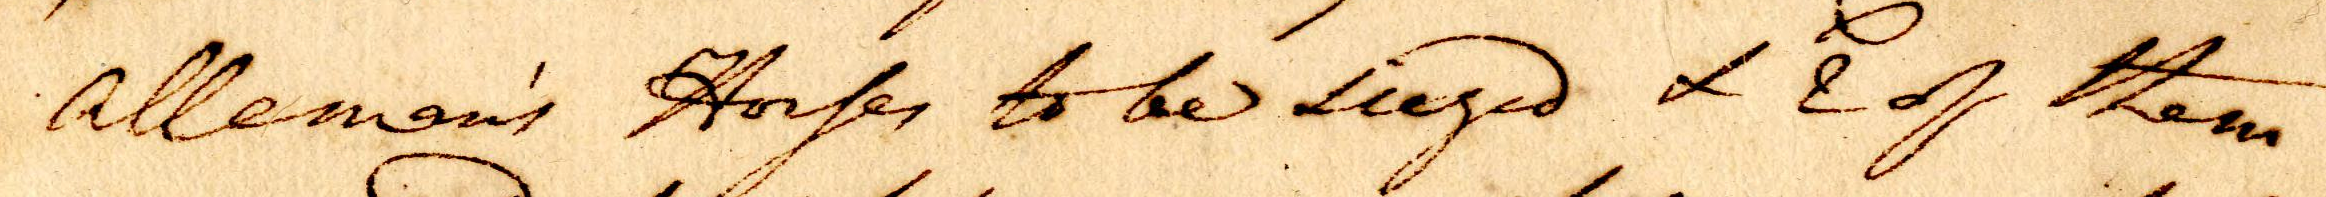Alleman's Horses to be siezed & 2 of them
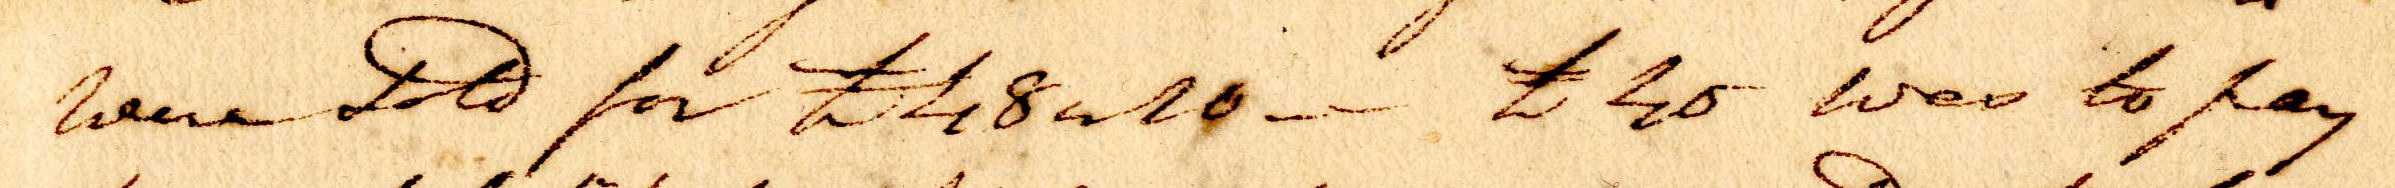were sold for £48[_]20-- £40 was to pay
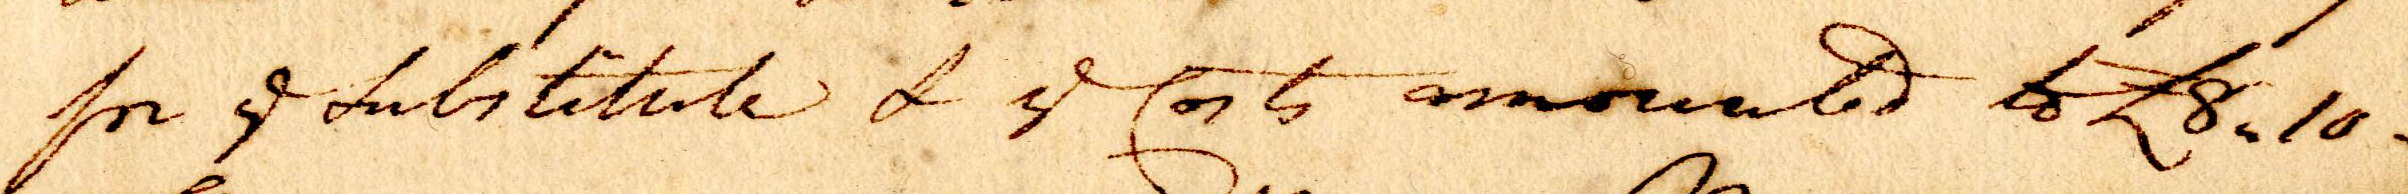for y^e substitute & y^e Costs amounted to £8.10-
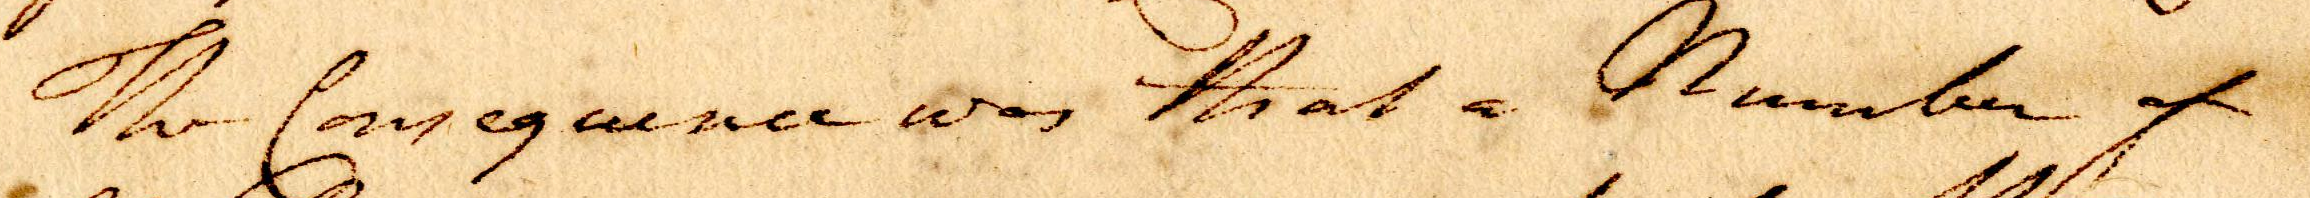The Consequence was that a Number of
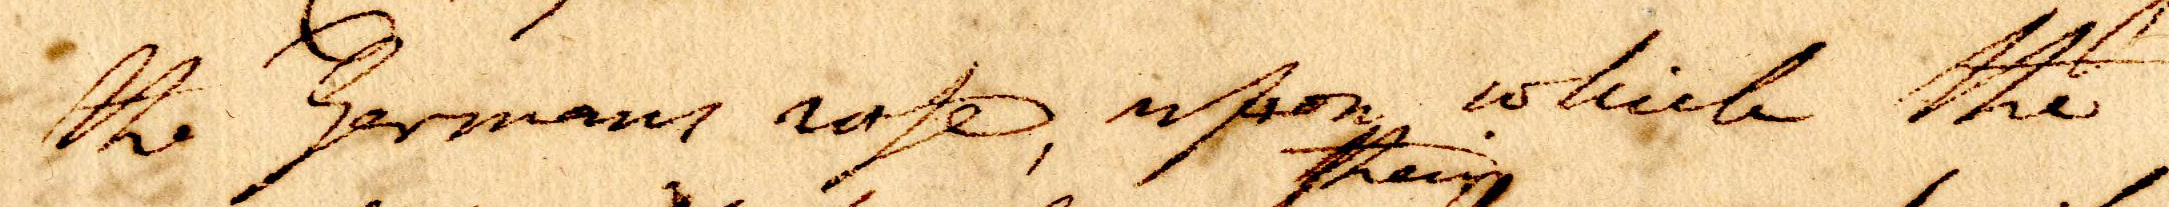the Germans rose, upon which the
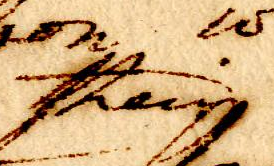their
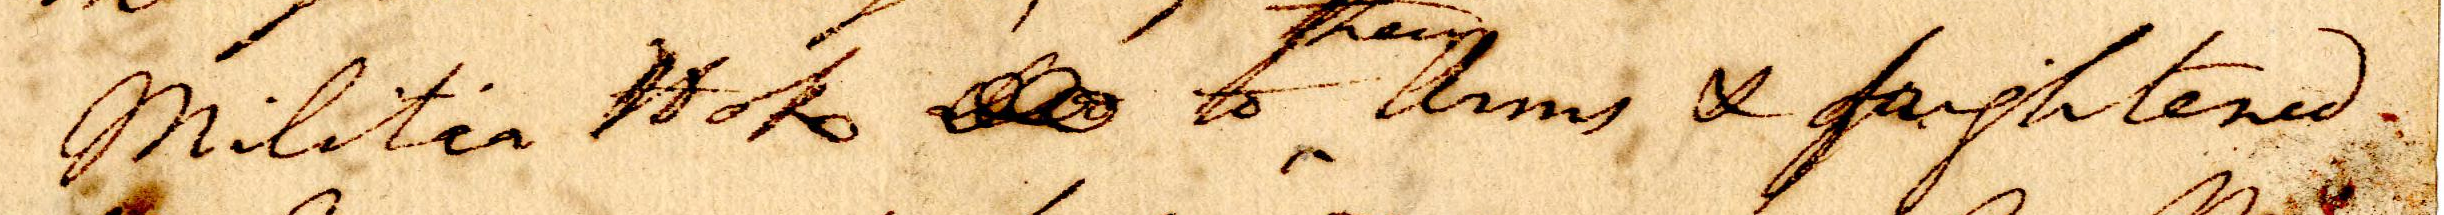Militia took to ^ Arms & frightened
